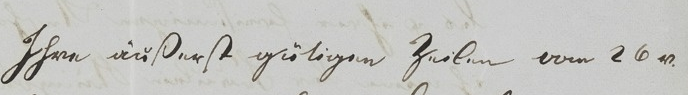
Ihre äußerst gütigen Zeilen vom 26. v.
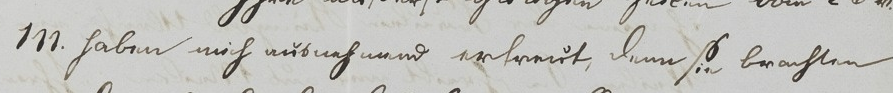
M. haben mich ausnehmend erfreut, denn sie brachten
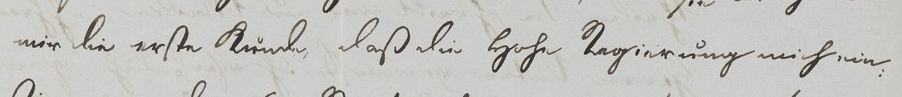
mir die erste Kunde, daß die hohe Regierung mich ein-
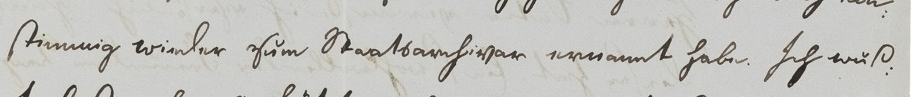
stimmig wieder zum Staatsarchivar ernannt habe. Ich wuß-
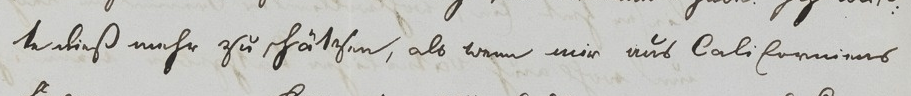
te dieß mehr zu schätzen, als wenn mir aus Californiens
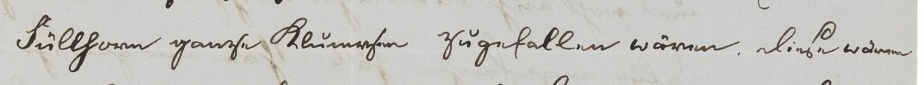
Füllhorn ganze Klumpen zugefallen wären. Diese wären
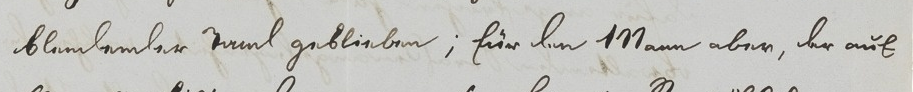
blendender Tand geblieben; für den Mann aber, der auf
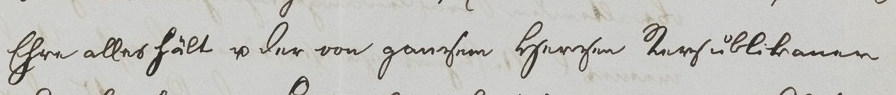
Ehre alles hält & der von ganzem Herzen Republikaner
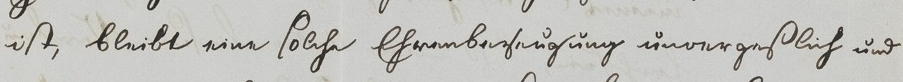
ist, bleibt eine solche Ehrenbezeugung unvergeßlich und
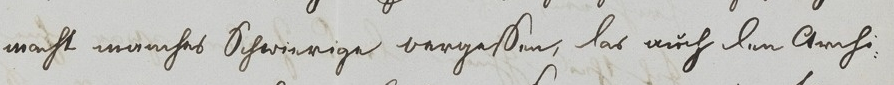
macht manches Schwierige vergessen, das auch den Archi-
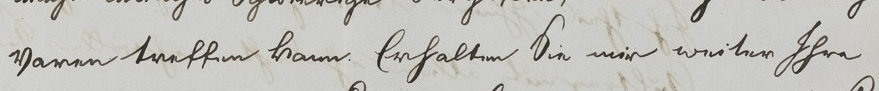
varen treffen kann. Erhalten Sie mir weiter Ihre
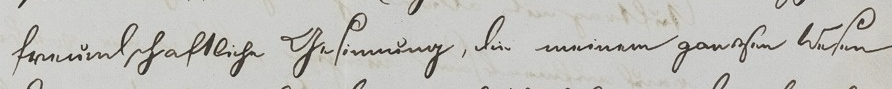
freundschaftliche Gesinnung, die meinem ganzen Wesen
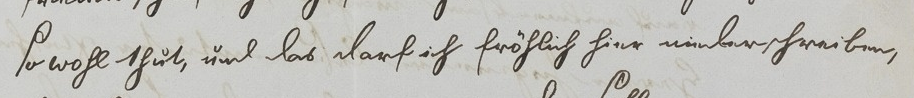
so wohl thut, und das darf ich fröhlich hier niederschreiben,
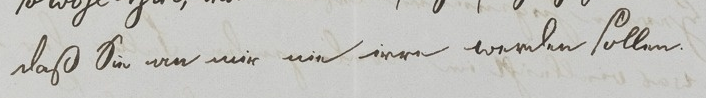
daß Sie an mir nie irre werden sollen.
